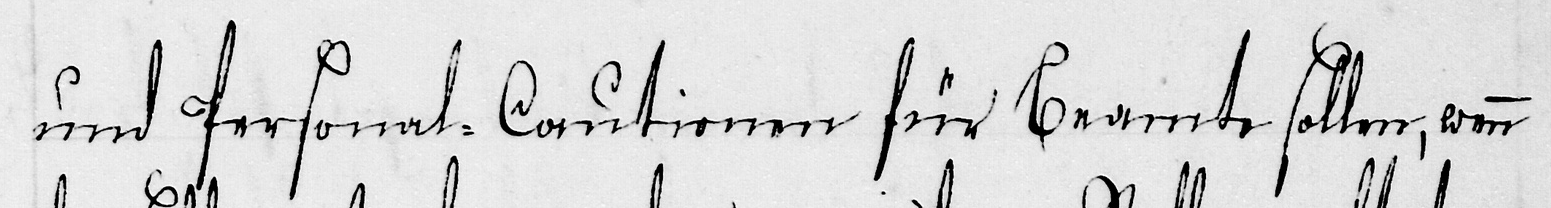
und Personal-Cautionen für Beamte sollen,
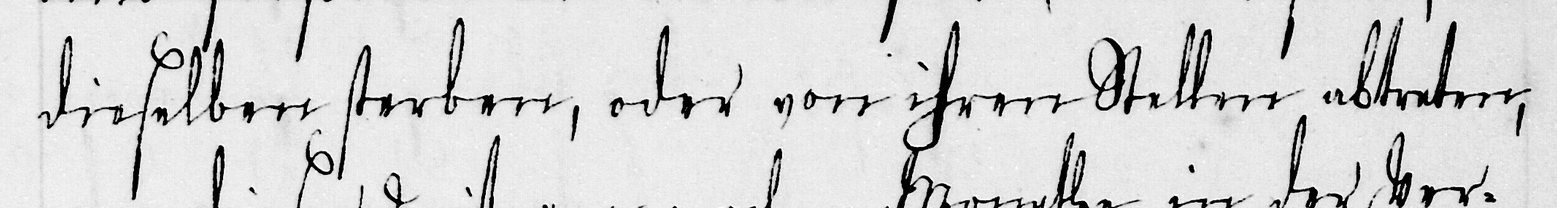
dieselben sterben, oder von ihren Stellen abtreten,
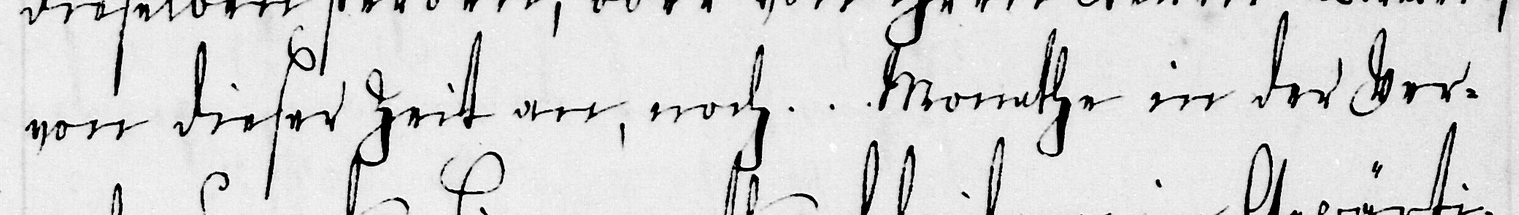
von dieser Zeit an, noch … Monathe in der Ver¬
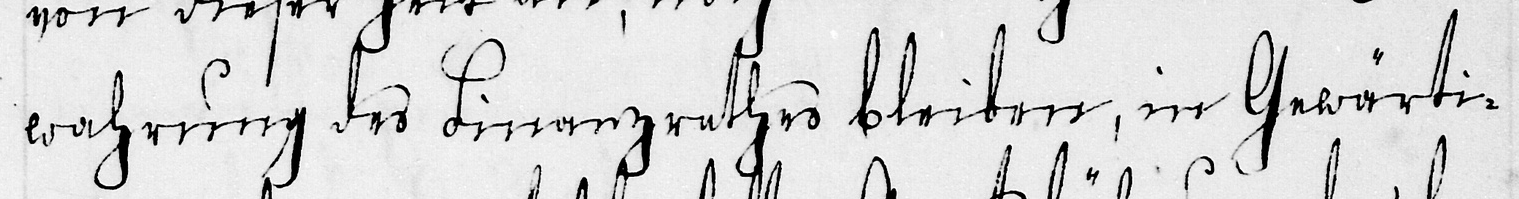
wahrung des Finanzrathes bleiben, in Gewärti¬
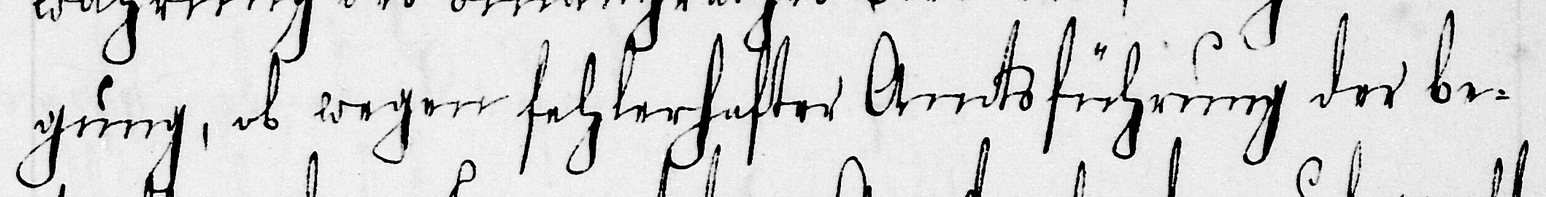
gung, ob wegen fehlerhafter Amtsführung der be¬
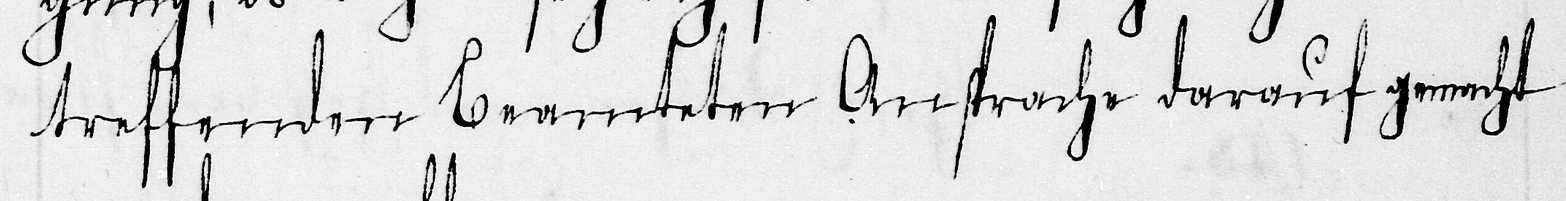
treffenden Beamteten Ansprache darauf gemacht
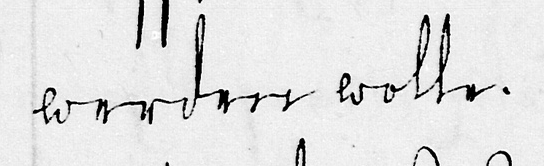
werden wolle.
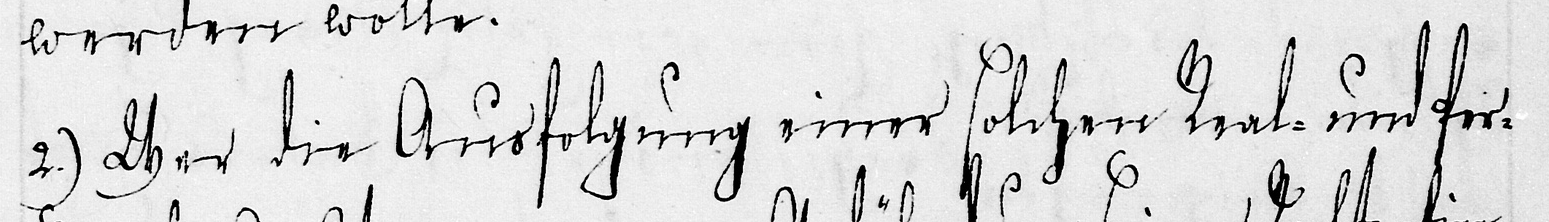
2.) Wer die Ausfolgung einer solchen Real- und Per¬
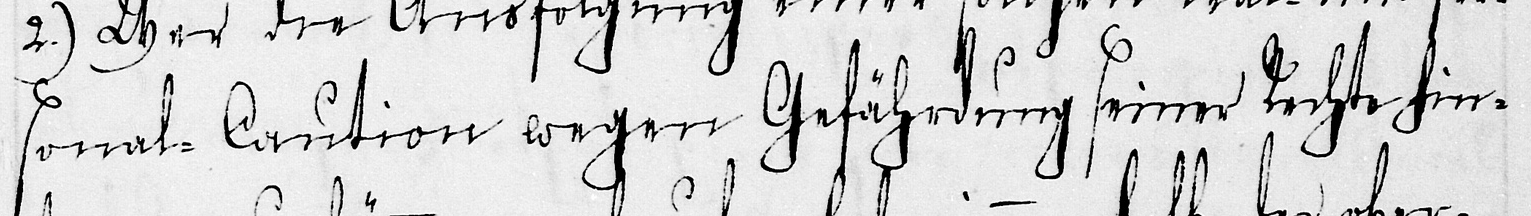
sonal- Caution wegen Gefährdung seiner Rechte hin¬
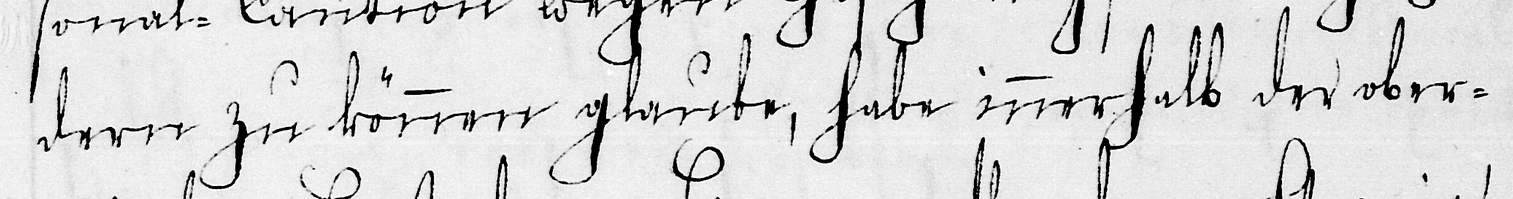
dern zu können glaube, habe innerhalb der ober¬
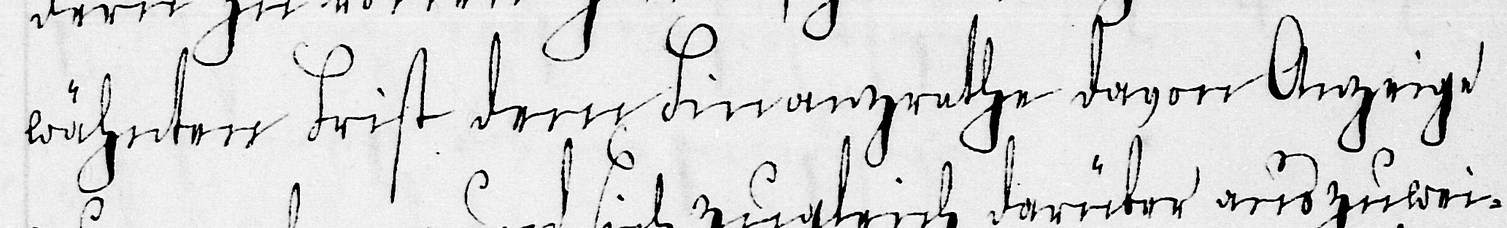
wähnten Frist dem Finanzrathe davon Anzeige
